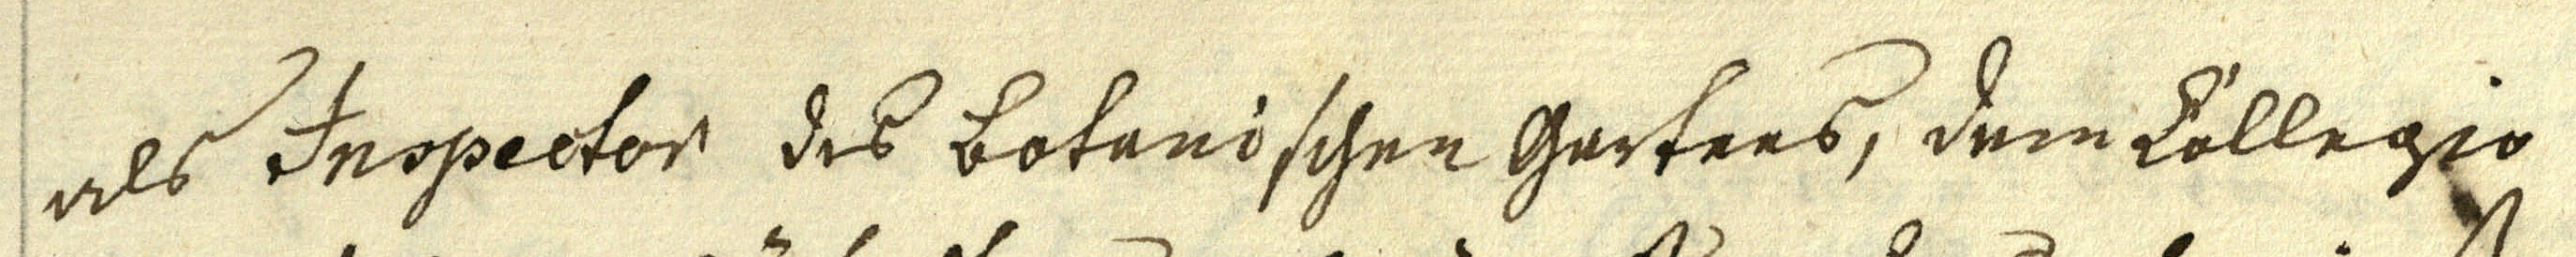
als Inspector des Botanischen Gartens, dem Collegio
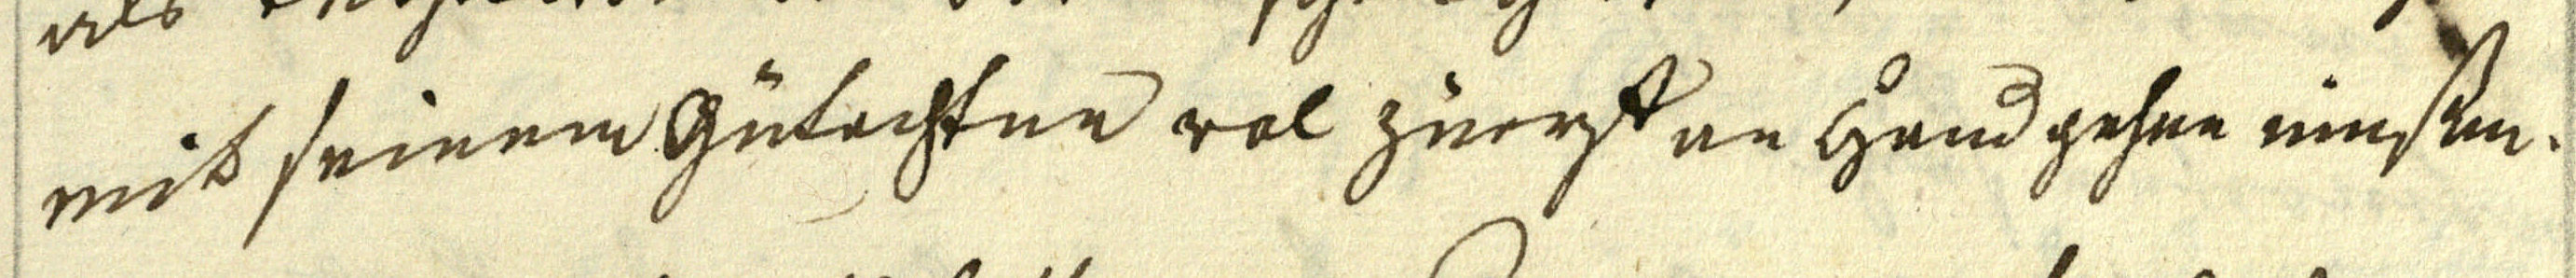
mit seinem Gutachten wol zuerst an Hand gehen müßen.
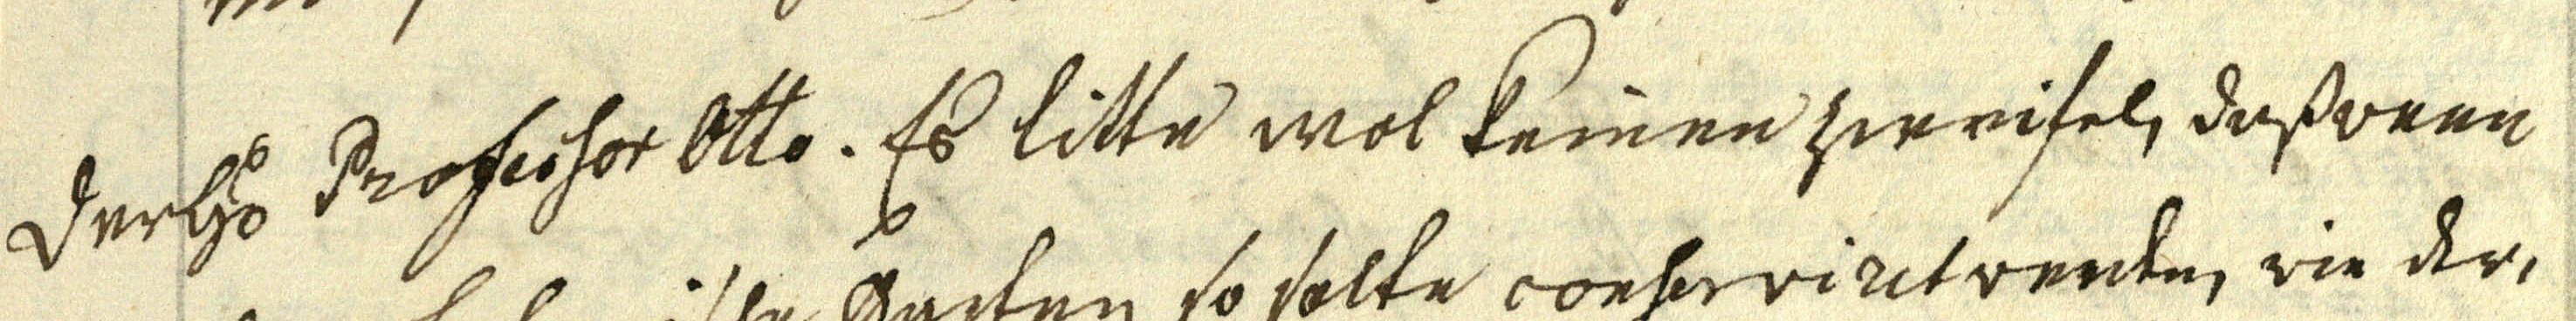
Der H Professor Otto. Es litte wohl keinen Zweifel, daß wenn
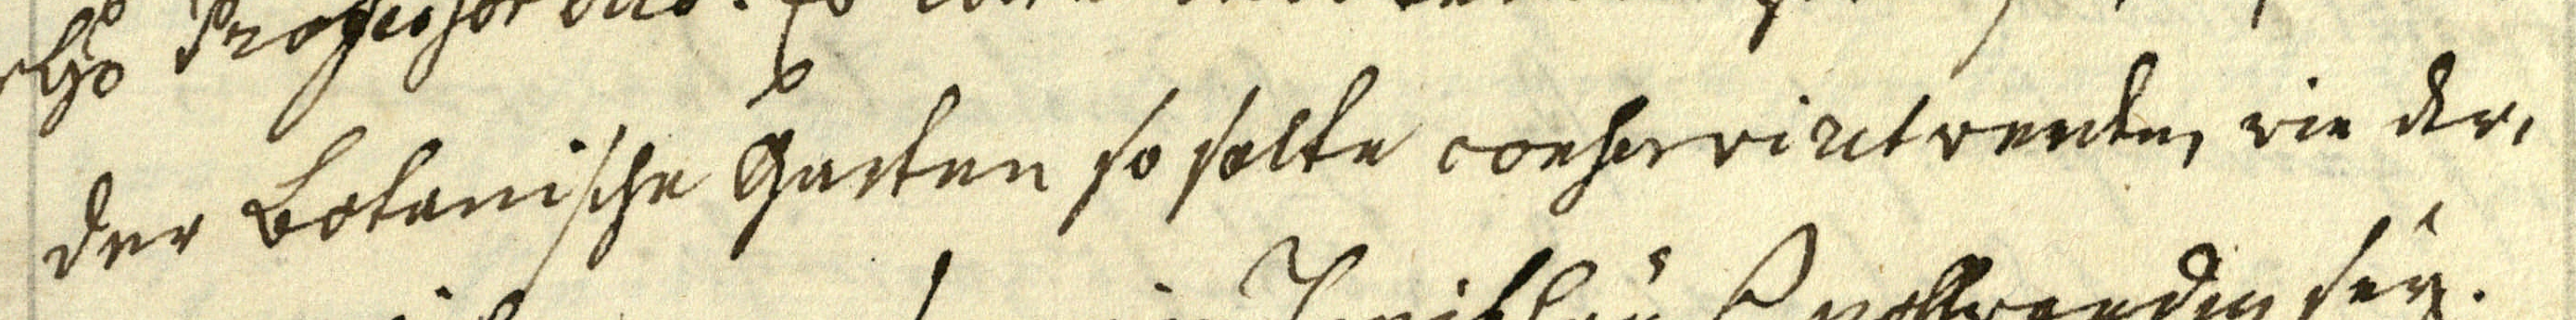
der Botanische Garten so solte conserviret werden, wie der¬
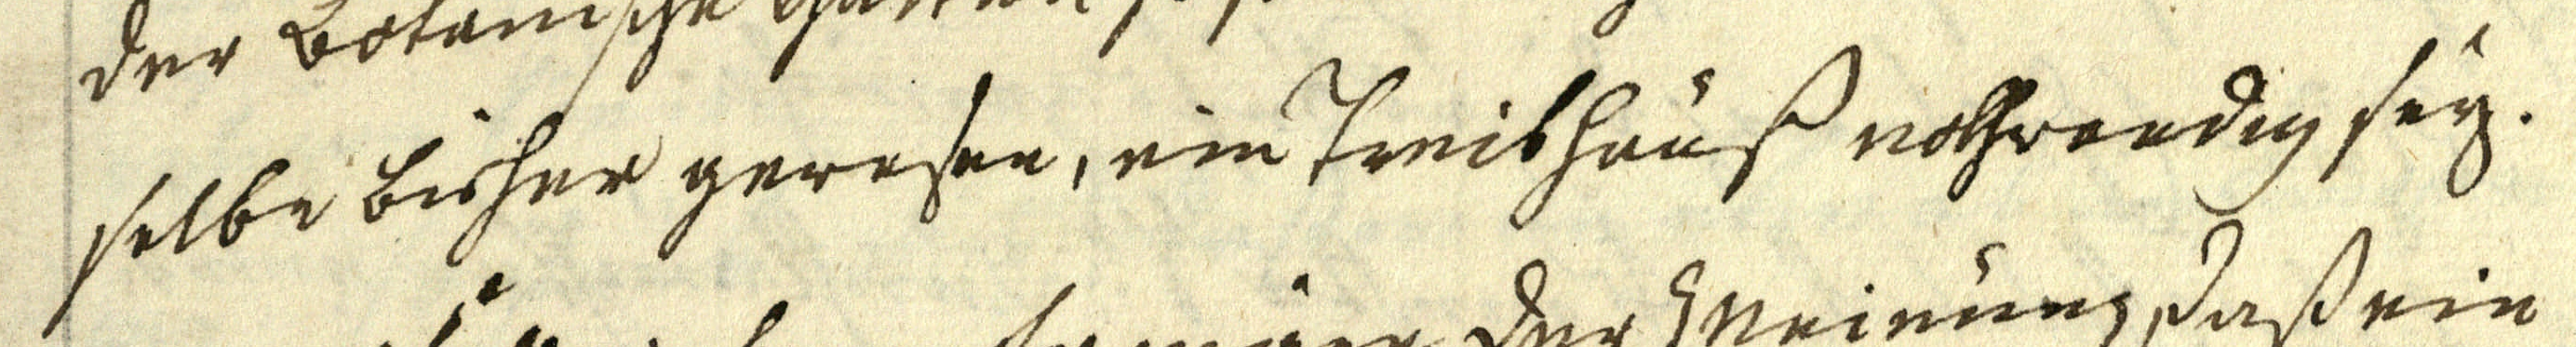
selbe bisher gewesen, ein Treibhaus nothwendig seÿ.
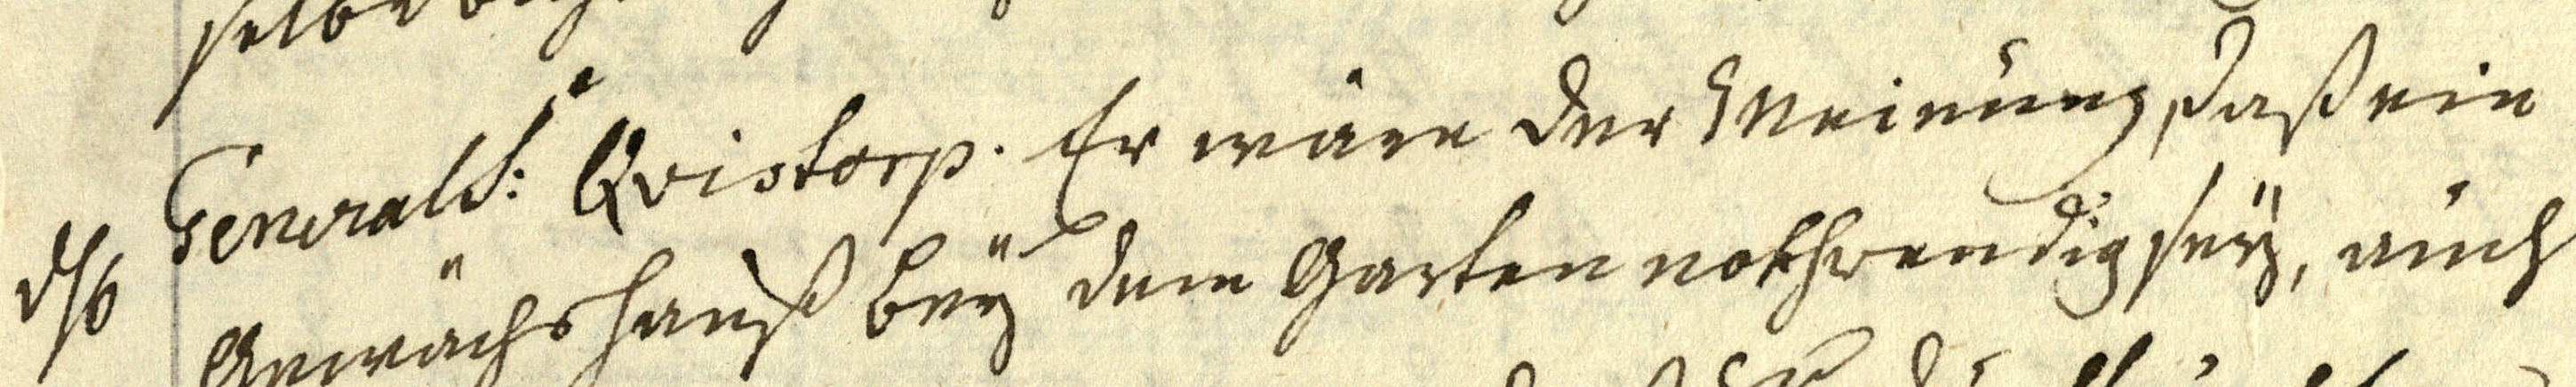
dh GeneralS. Quistorp Er wäre der Meinung, daß ein
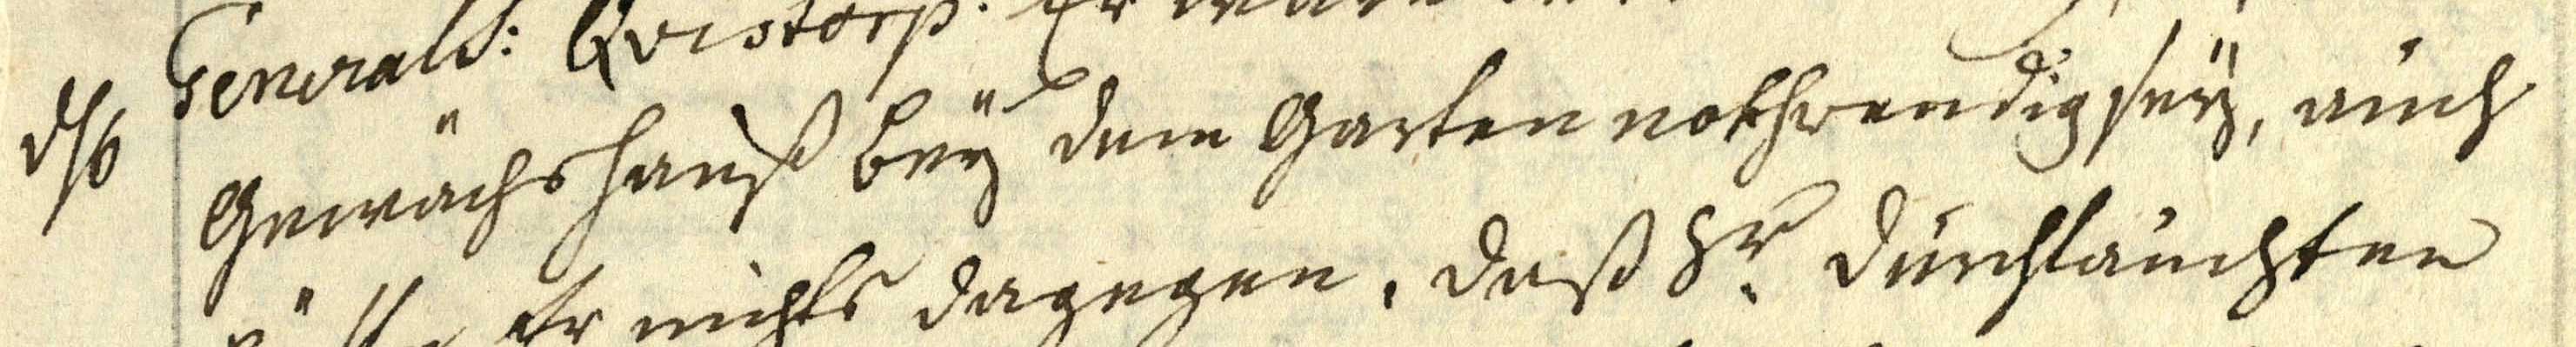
Gewächshauß beÿ dem Garten nothwendig seÿ, auch
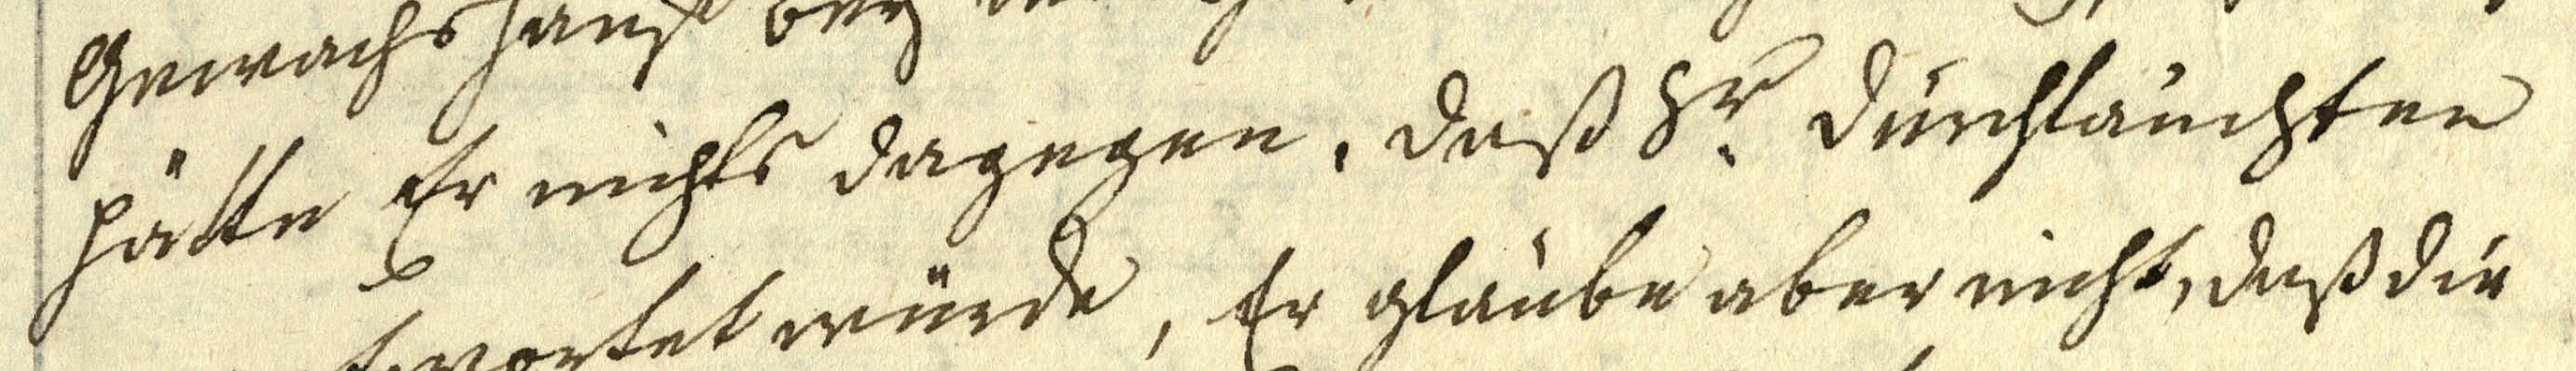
hätte Er nichts dagegen, daß Sr Durchlauchten
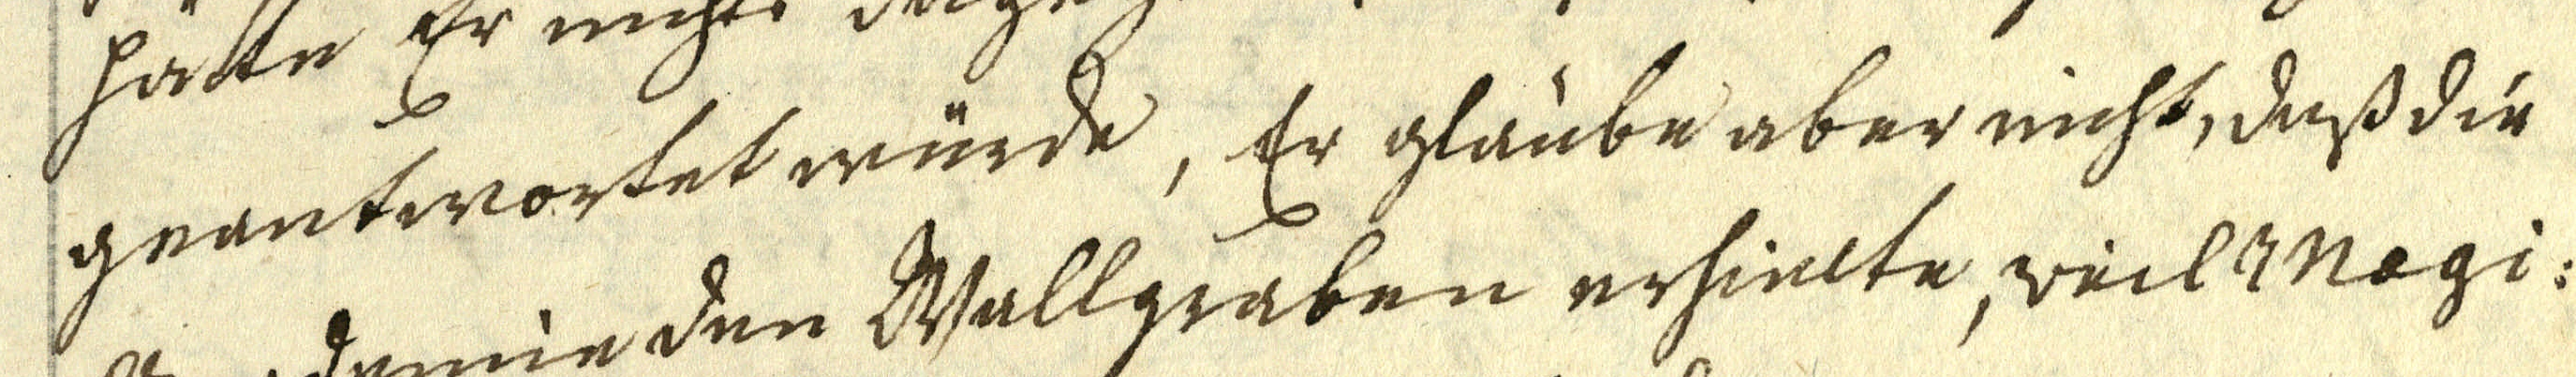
geantwortet würde, Er glaube aber nicht, daß die
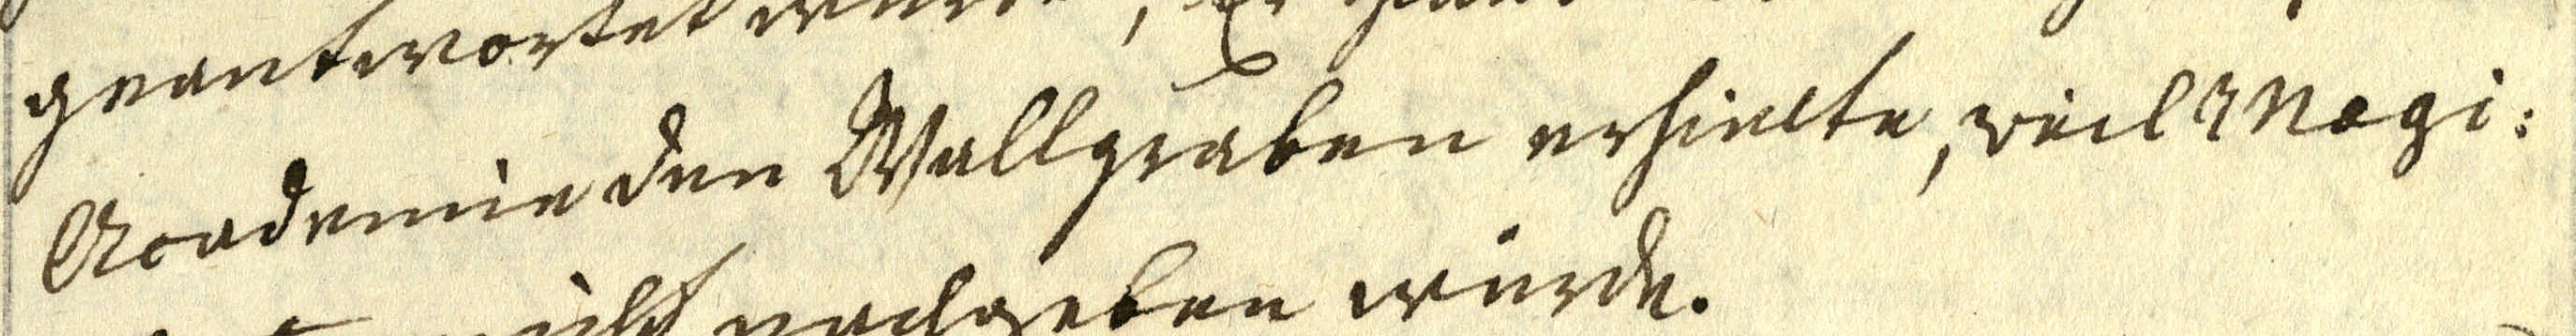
Academie den Wallgraben erhielte, weil Magi¬
